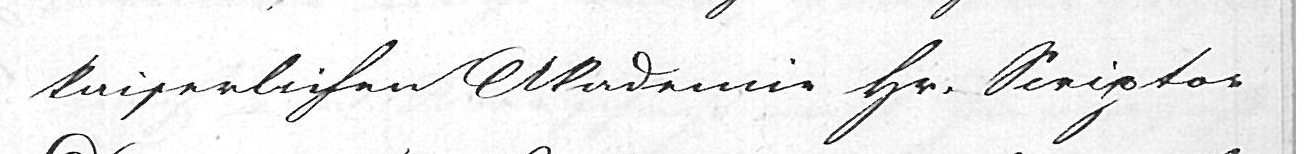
kaiserlichen Akademie Hr. Scriptor
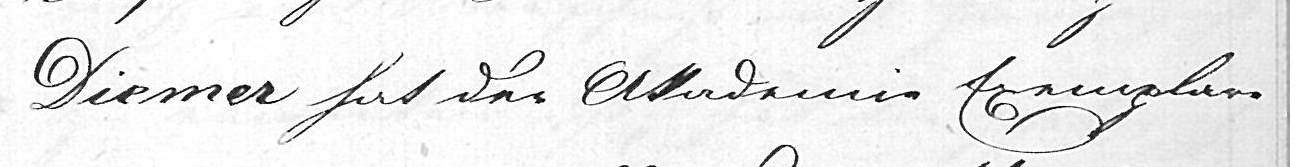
Diemer hat der Akademie Exemplare
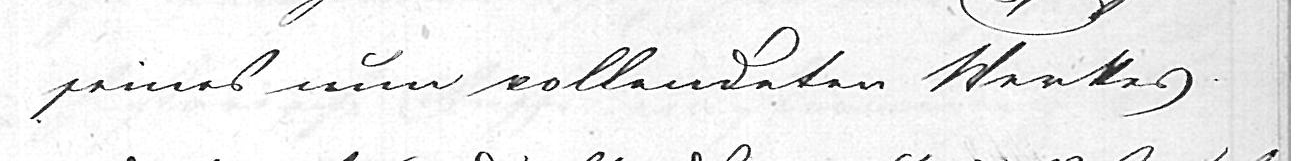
seines nun vollendeten Werkes
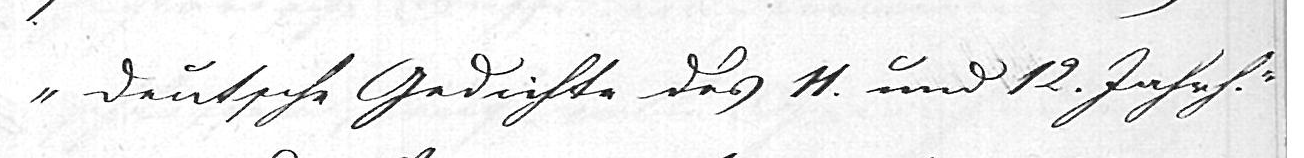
"Deutschen Gedichte des 11. und 12. Jahrh."
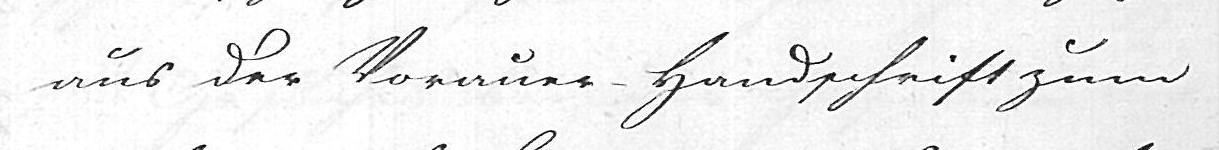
aus der Vorauer Handschrift zum
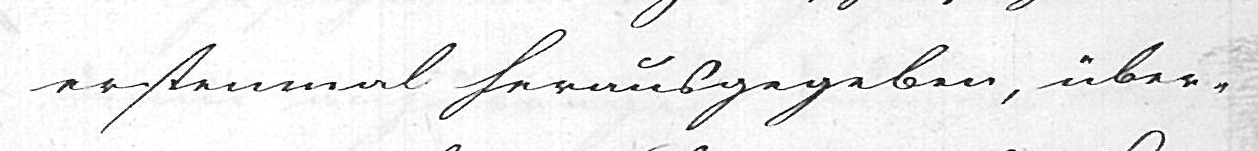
erstenmal herausgegeben, über-
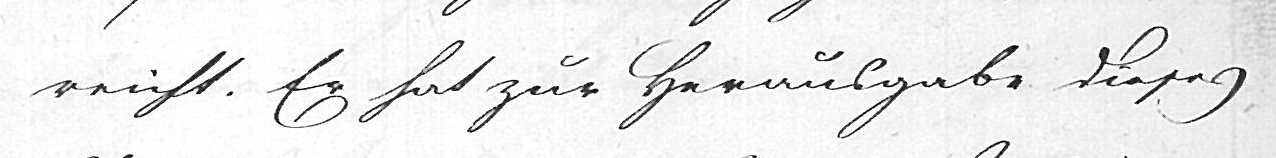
reicht. Er hat zur Herausgabe dieses
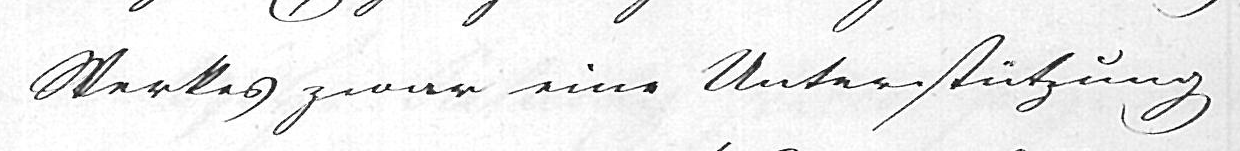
Werkes zwar eine Unterstützung
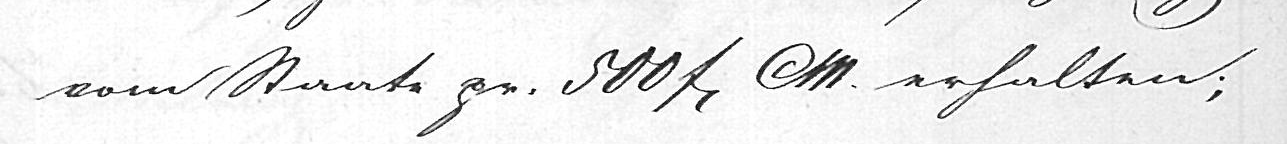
vom Staate pr. 500 fl. CM erhalten;
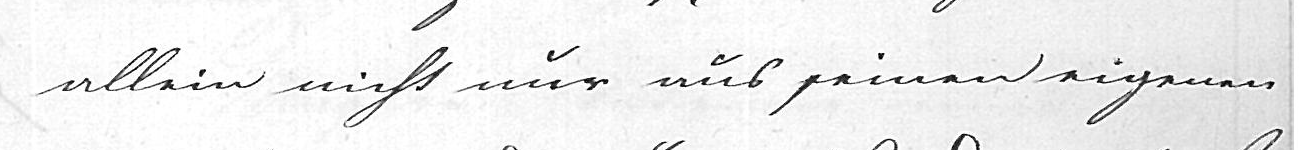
allein nicht nur aus seinen eigenen
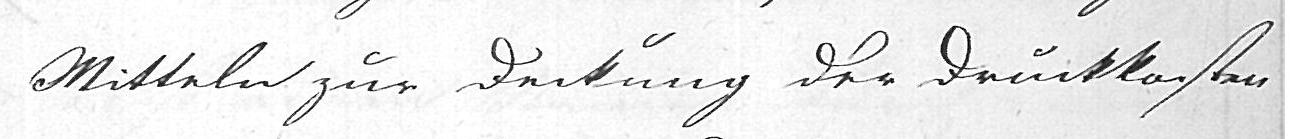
Mittel zur Deckung der Druckkosen
